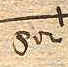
sor
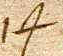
14
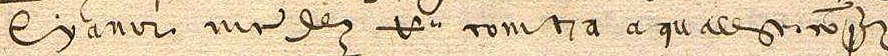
lyanor mēdez Re comtra a quall se cōp̄ir
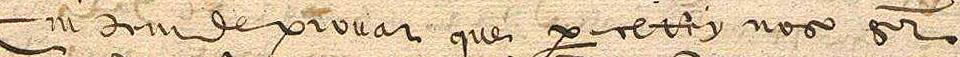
Emtemde prouar que ꝑ el Rey noso sōr
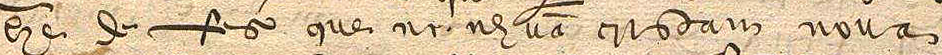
he defeso que nenhuā cristam noua
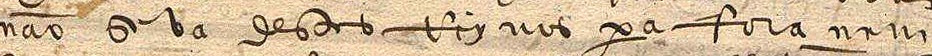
não se va destes Reynos ꝑa fora nem
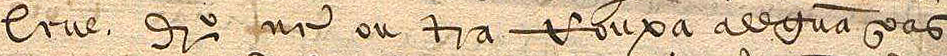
leue dro nē outra Roupa allgūa so as
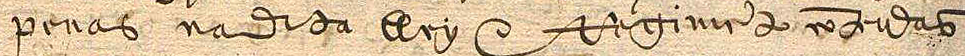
penas na dita lley e Regimēto c̄oteudas
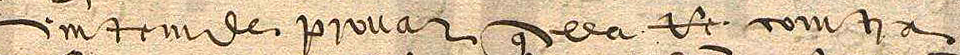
Emtemde prouar q̄ ella Re comtra
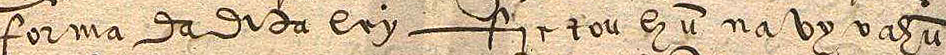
forma da dita ley fretou hū navyo a hū
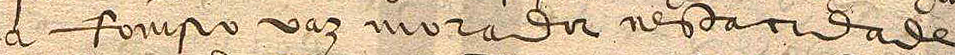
afomsso vaz morador nesta cidade
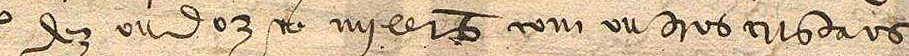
p̄o dez ou doze mjll r̄s com outros cristaos
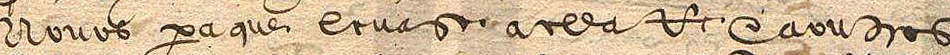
Nouos ꝑa que leuase a ella Re e a outros
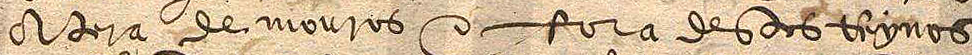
A tera de mouros e fora destes Reynos
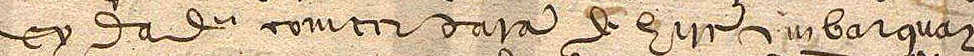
cydade comcertarā de hirē embarquar
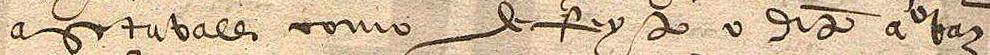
a setuvall como de feyto o dito ao vaz
